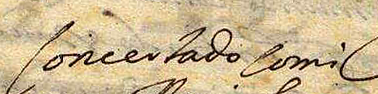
Concertado comi
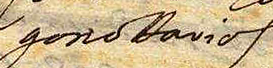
go notário
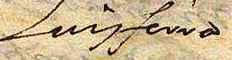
Luis ferraõ
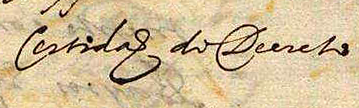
Certidaõ do Decreto
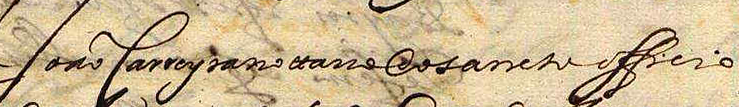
Joaõ Carreyra nottario do Sancto officio
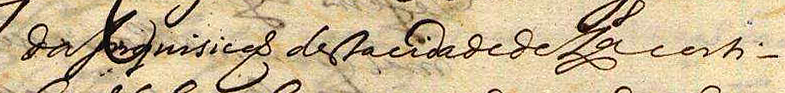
da Jnquisiçaõ desta cidade de Lxa certo
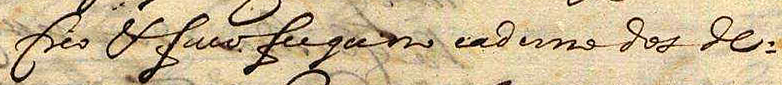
fico & faço fee que no caderno dos de
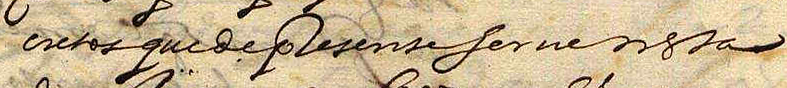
cretos que de presente segue nesta
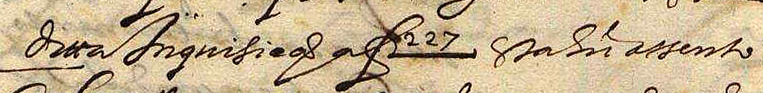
ditta Inquisiçaõ a fl 227 esta hū assento
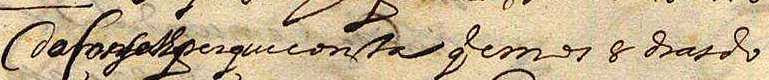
do Conselho perque consta q̄ em os 8 dias do
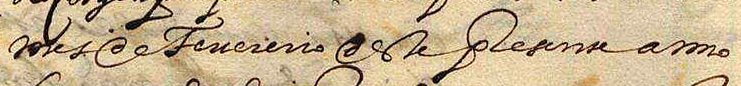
mes de Feuereiro deste presente anno
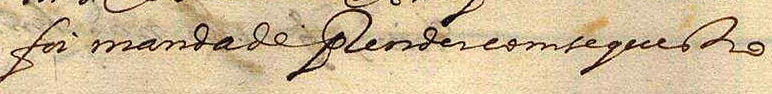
foi mandado prender com sequestro
